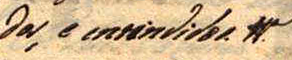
dos, e entindidos. etc
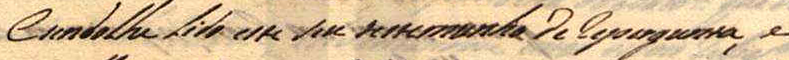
E sendo-lhe lido este seu testemunho de Repergunta, e
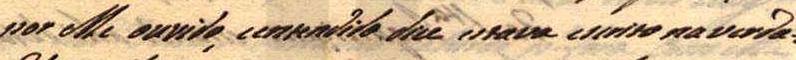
por elle ouvido, e entendido dice estava escrito na verda
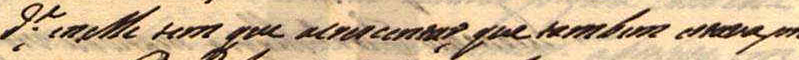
d;e e nelle tem que acrescentar, que tambem estava pre
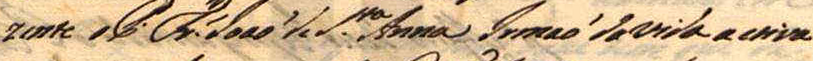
zente o P. Fr̄. Ioaõ de S.ta Anna Irmaõ da vida activa
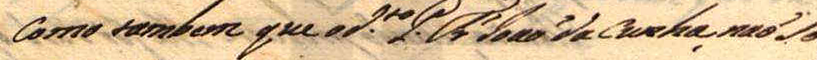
como tambem que o d.to P.Fr̄. Ioaõ da Cunha, naõ só
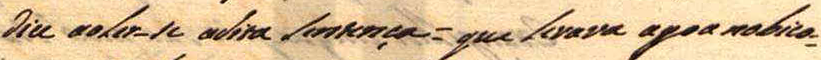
dice ao ler-se a dita sentença = que levava agoa no bico =
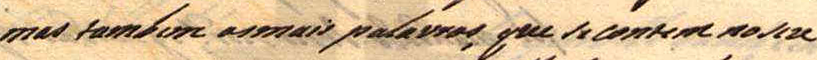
mas tambem as mais palavras, que se contem no seu
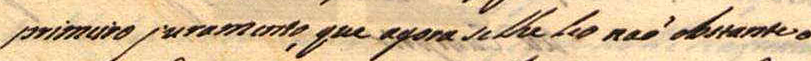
primeiro juramento, que agora se lhe leo naõ obstante o
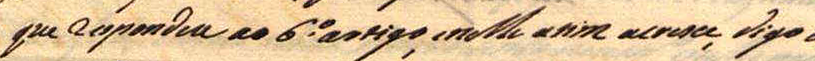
que respondeu ao 6.o artigo, e nelle assim acresce, digo o
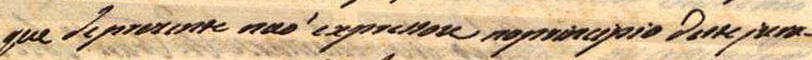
que de prezente naõ expressou no principio deste jura
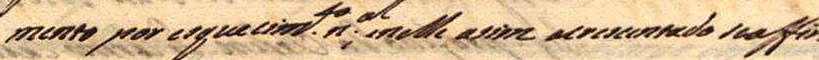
mento por esquecim.to n;al e nelle asim acrescentado se affir
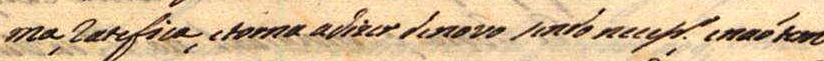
ma, Ratifica, e torna a dizer de novo sendo necess.o e naõ tem
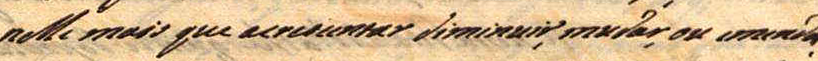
nelle mais que acrescentar diminuir, mudar, ou emendar
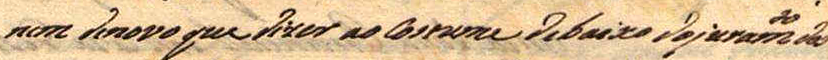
nem de novo que dizer ao costume debaixo do juram.to dos
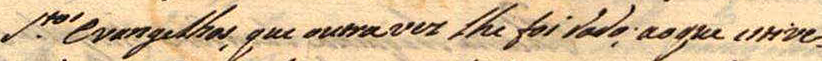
s.tos Evangelhos, que outra vez lhe foi dado; ao que estive
